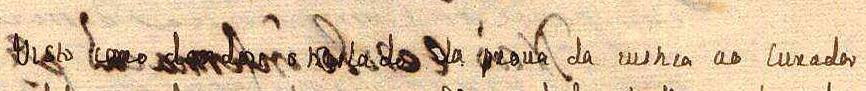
Visto como dandose o traslado da proua da iustica ao curador
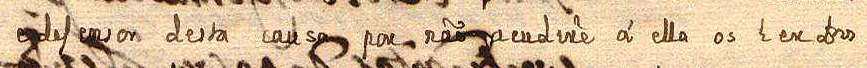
e defensor desta causa por não acudirē á ella os herdros
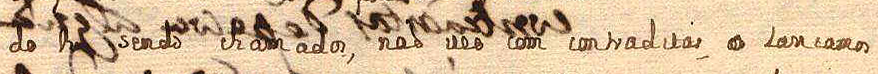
do R sendo chamados, naõ ueo com contraditas, o Lancamos
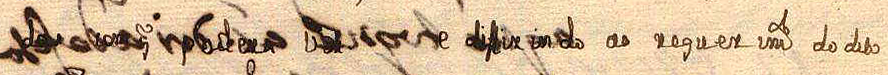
das com q̄ podera v_ e diffirindo ao requerimto do dito
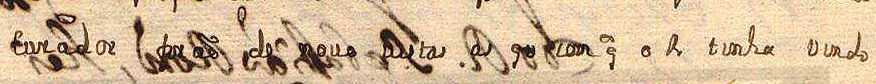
curador porão de nouo a estas as qu com q̄ o R tinha vindo
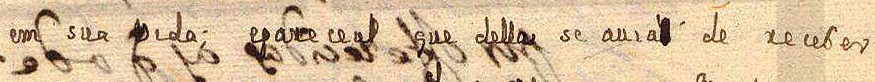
em sua vida; e pareceo que della se auia_ de receber
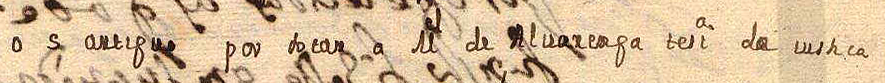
o 5 artiguo por tocar a Mel de Aluarenga testa da iustica
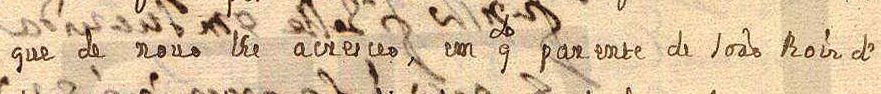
que de nouo lhe acresceo, emqto parente de Ioão Roiz de
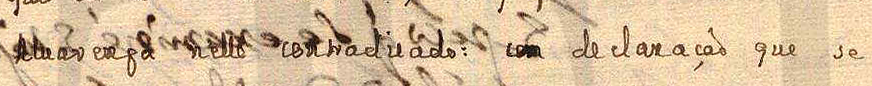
Aluarenga nelle contraditado: com declaraçaõ que se
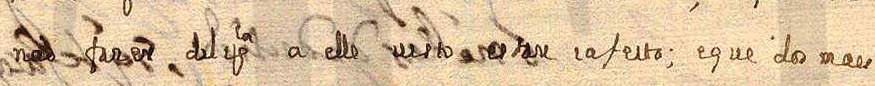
não fazer diligca a elle uisto estar ia feito; e que dos maes
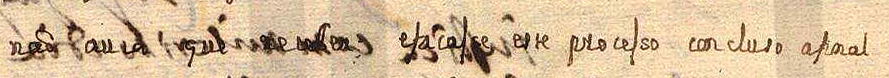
naõ auia que receber e facasse este processo concluso afinal
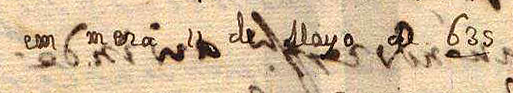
em meza 11 de Mayo de 635
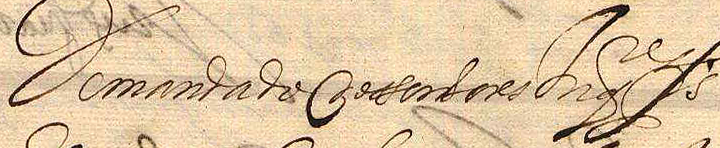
Demandado dos senhores Inqres fis
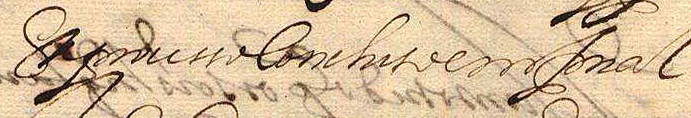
este processo Concluso em final
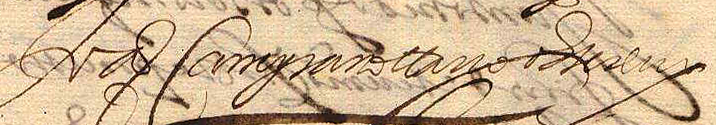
Joaõ Carreyra nottario o Escreuy
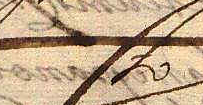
Clo
